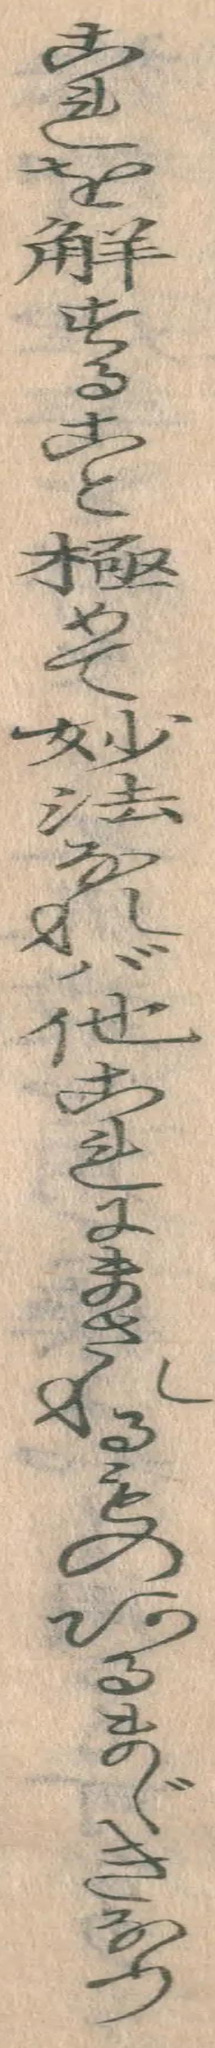これを解すること極めて妙法なれば他これにまされるものあるまじきなり
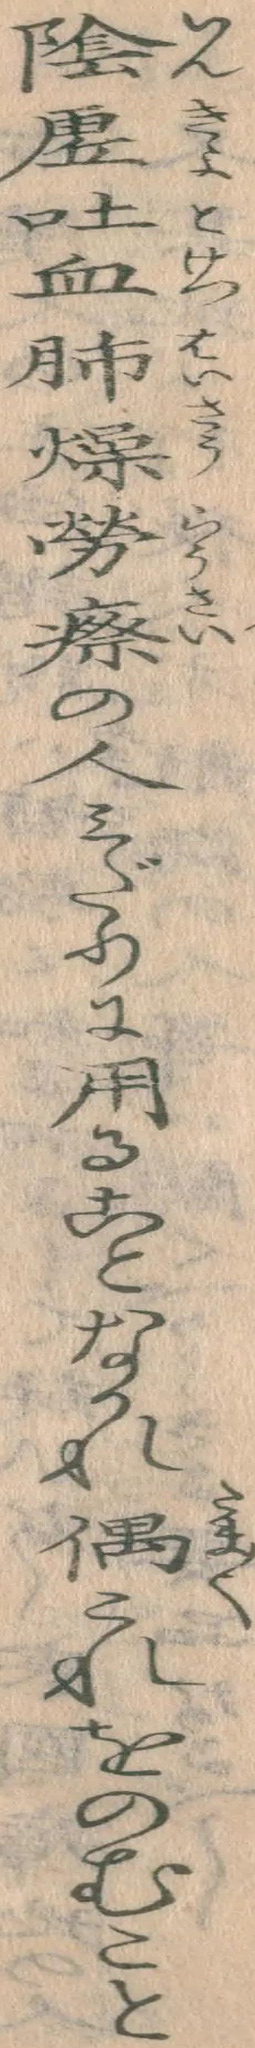陰虚吐血肺燥労瘵の人みだりに用ることなれ偶これをのむこと
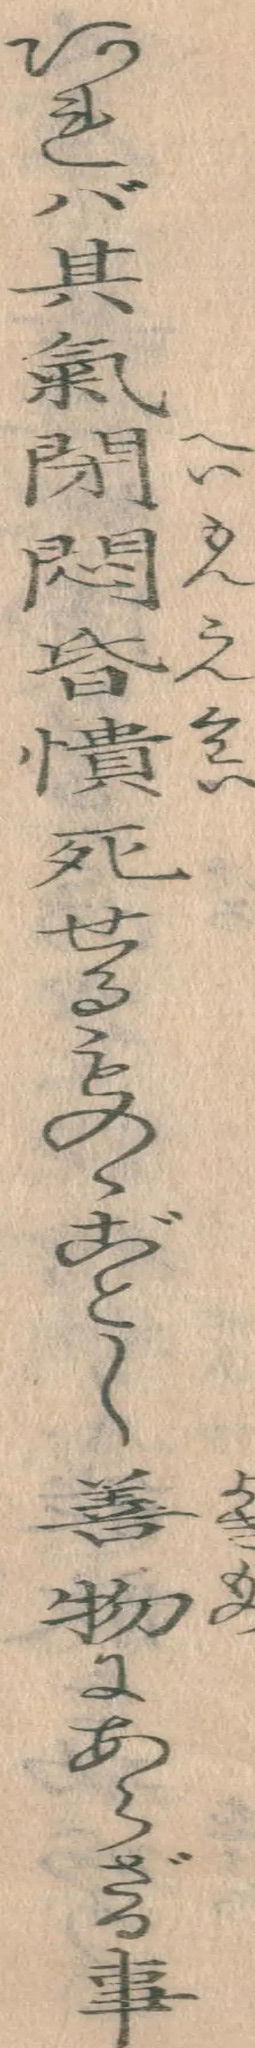あれば其気閉悶昏憒死せるものゝごとし善物にあらざる事
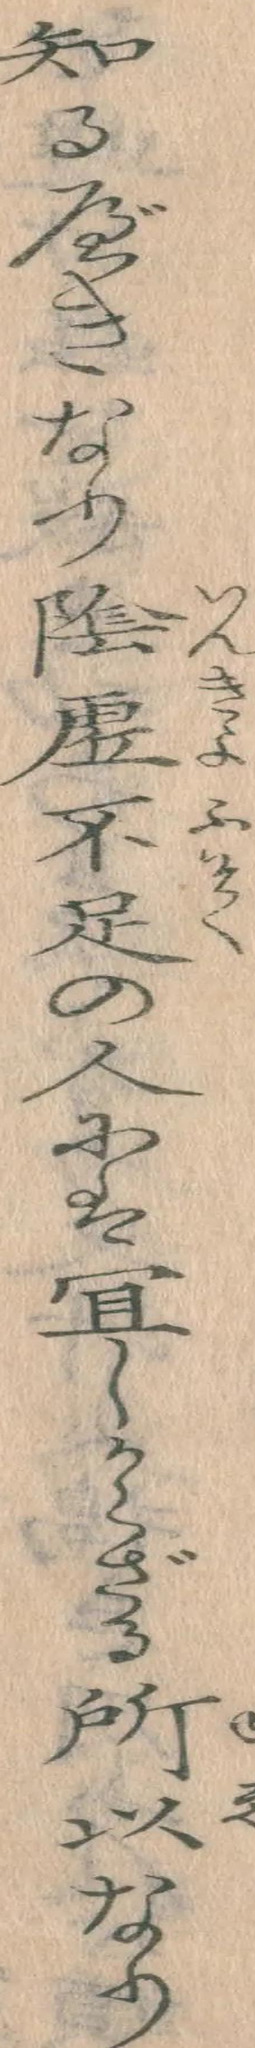知るべきなり陰虚不足の人には宜しからざる所以なり
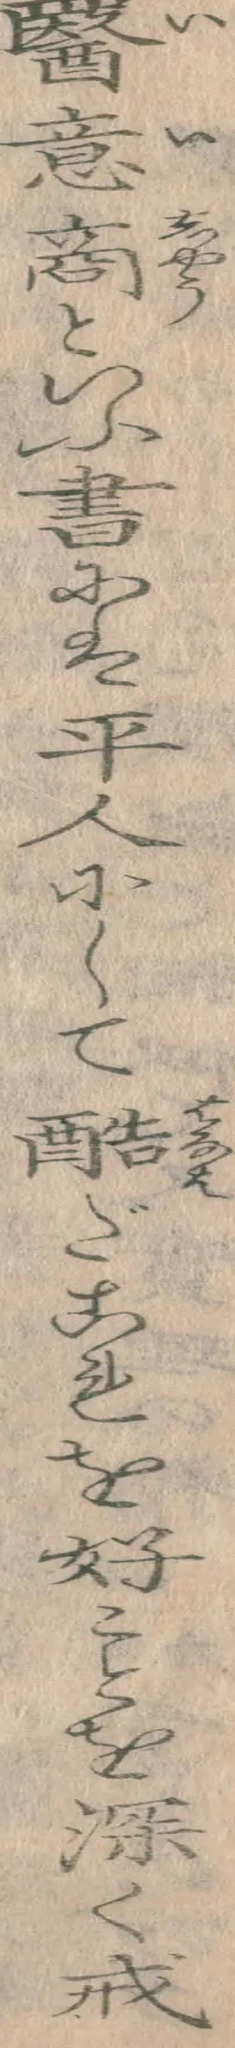医意商といふ書には平人にして酷だこれを好ことを深く戒
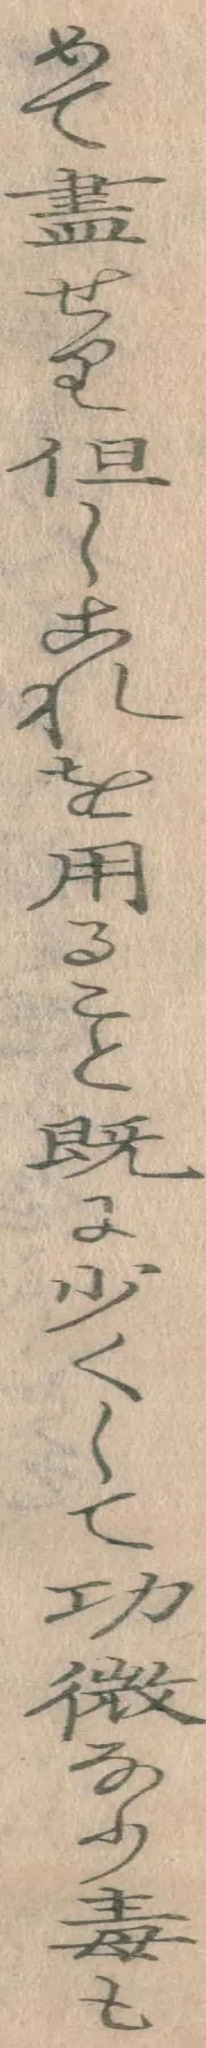めて尽せり但しこれを用ること既に少くして功微なり毒も
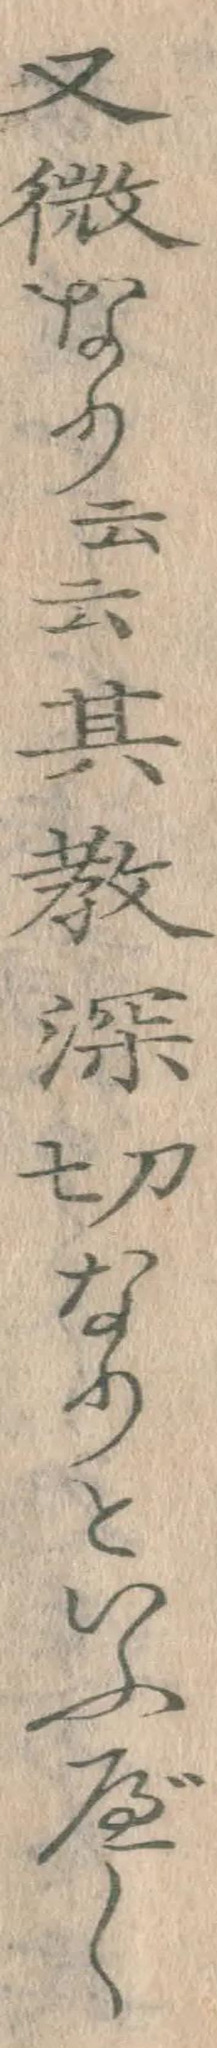又微なり云云其教深切なりといふべし
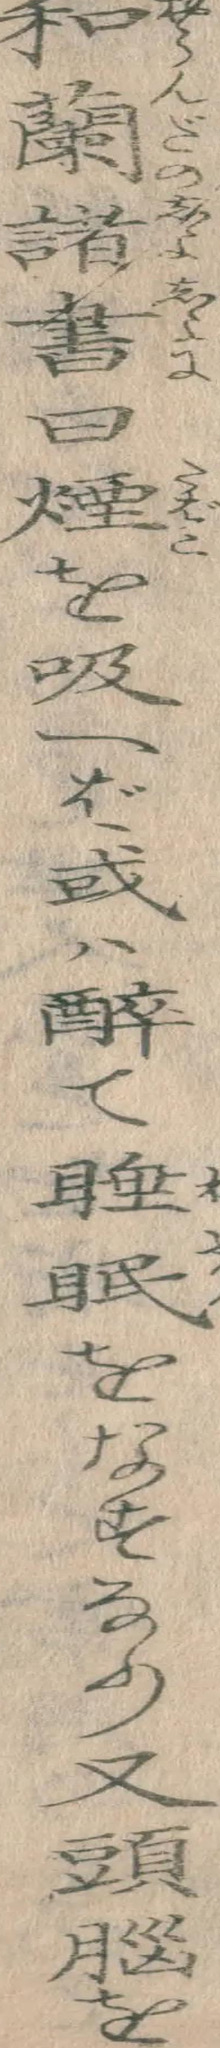和蘭諸書曰煙を吸へば或は酔て睡眠をなすなり又頭脳を
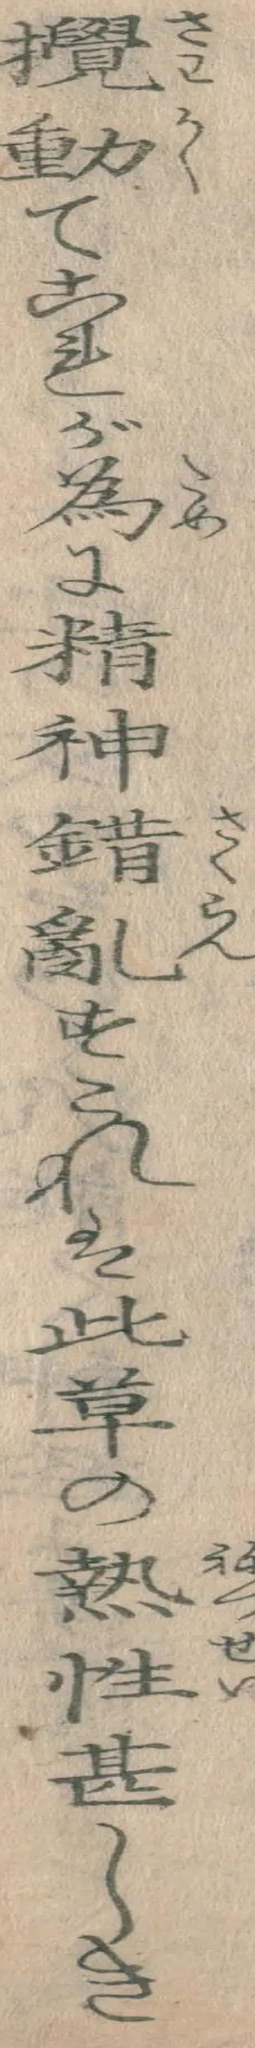攪動てこれが為に精神錯乱すこれは此草の熱性甚しき
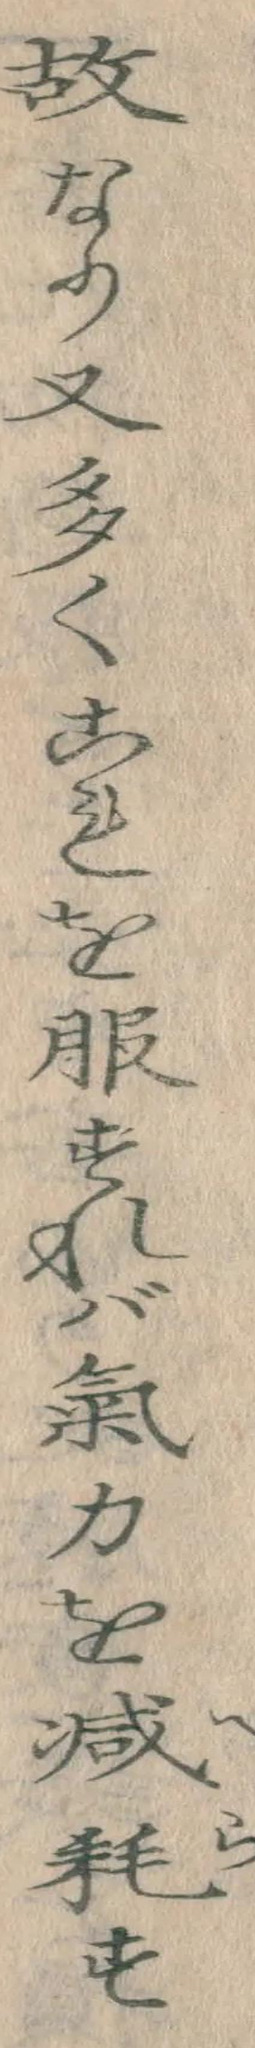故なり又多くこれを服すれば気力を減耗す
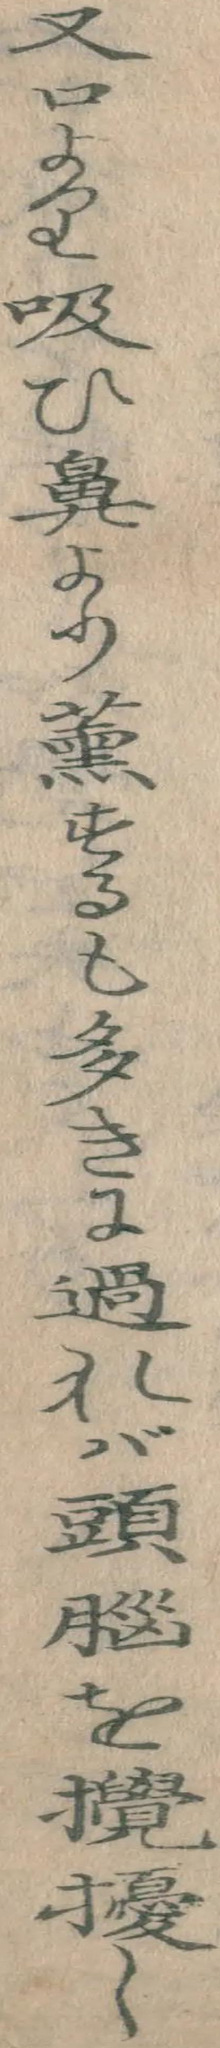又口より吸ひ鼻より薫するも多きに過れば頭脳を攪擾し

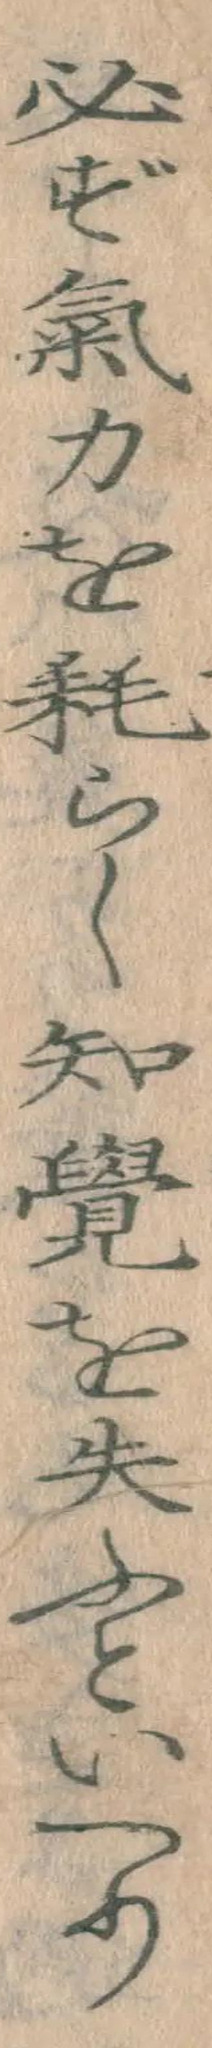必ず気力を耗らし知覚を失ふといへり
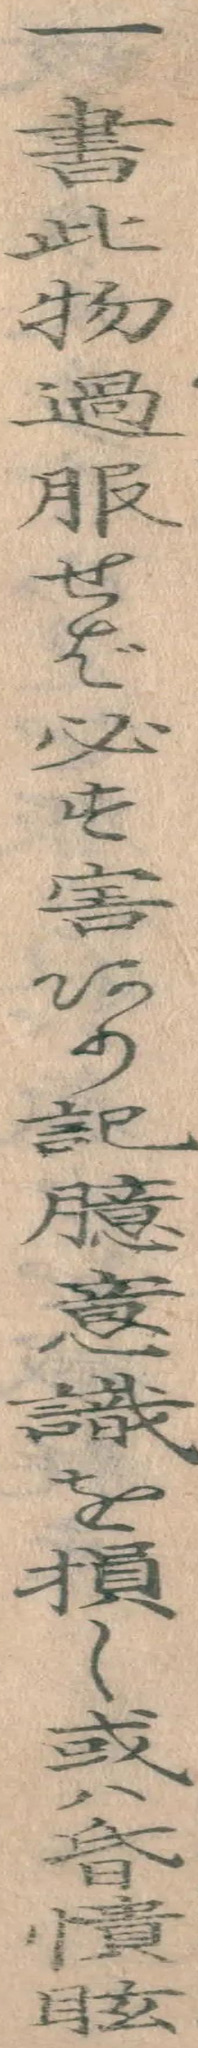一書此物過服せば必す害あり記臆意識を損し或は昏憒眩
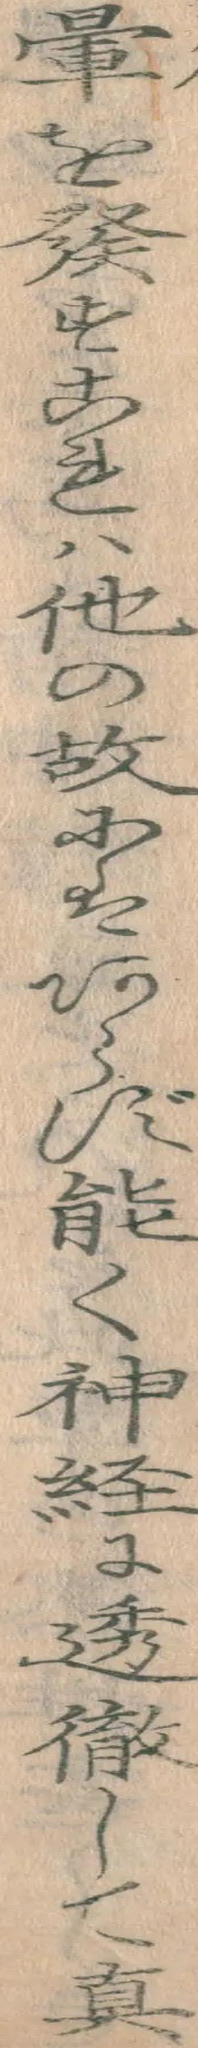暈を発すこれは他の故にはあらず能く神経に透徹して真
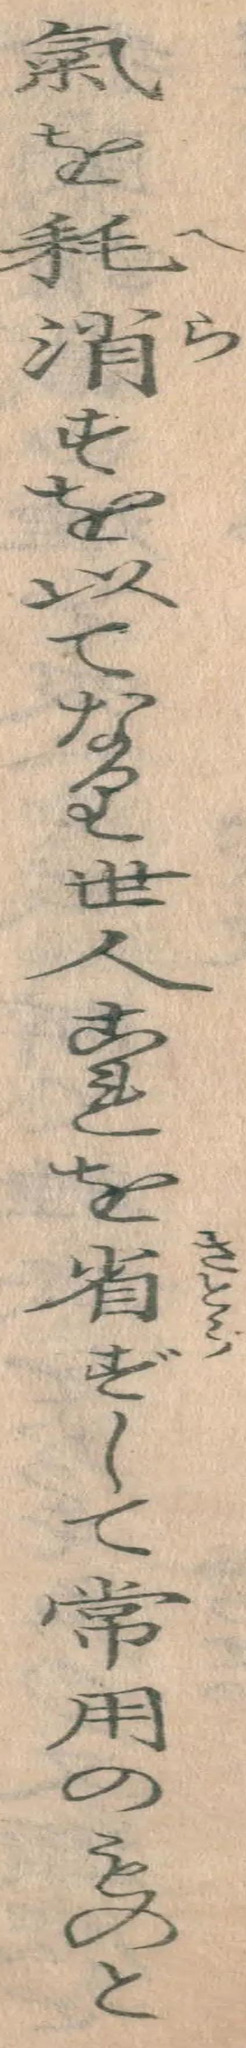気を耗消すを以てなり世人これを省ずして常用のものと
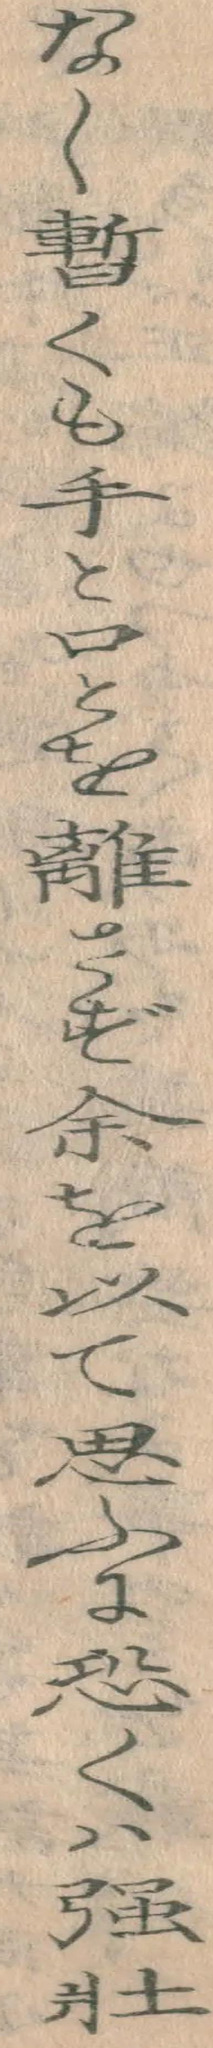なし暫くも手と口とを離さず余を以て思ふに恐くは強壮
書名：目さまし草
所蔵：国立国会図書館 National Diet Library, JAPAN
